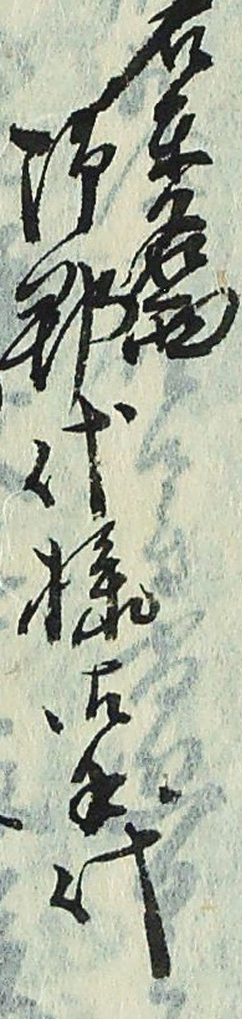御郡代様御手代
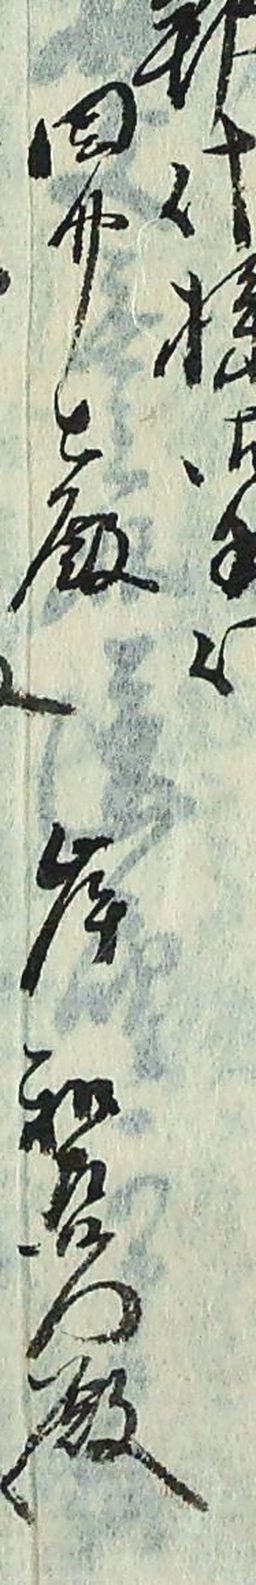岡介七殿岸和左衛門殿
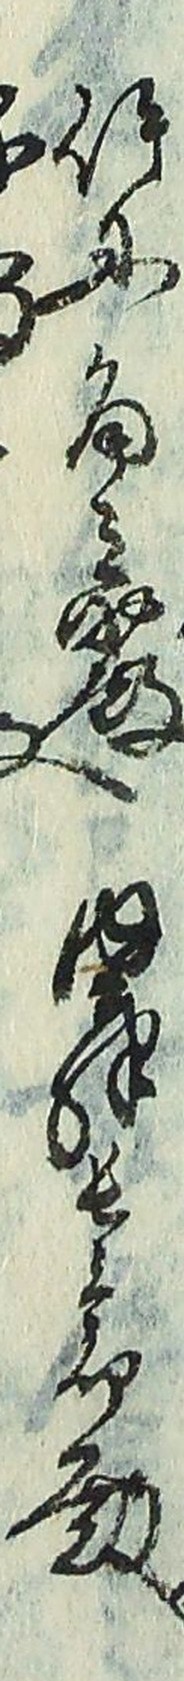伊丹角之助殿内藤長三郎殿
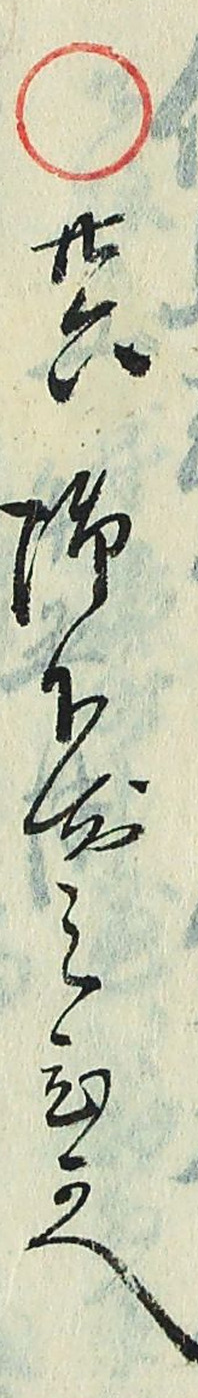○廿六御下知之ひかへ
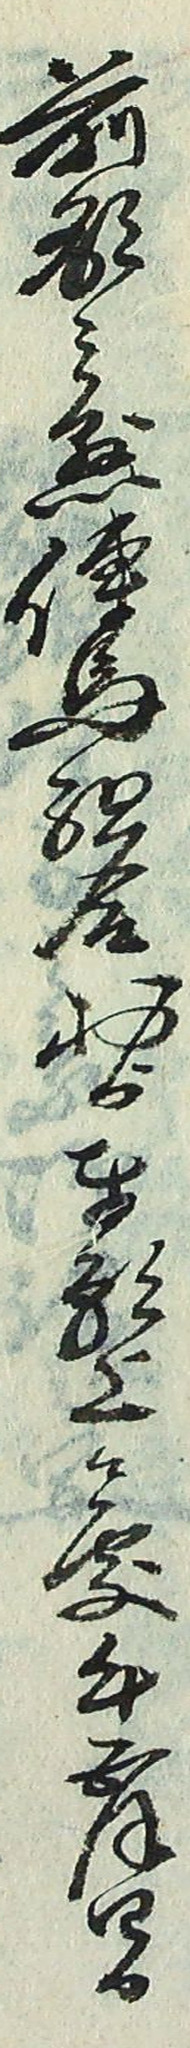前顕之懸傳馬組合村ゟ奉願上候處午五月四日
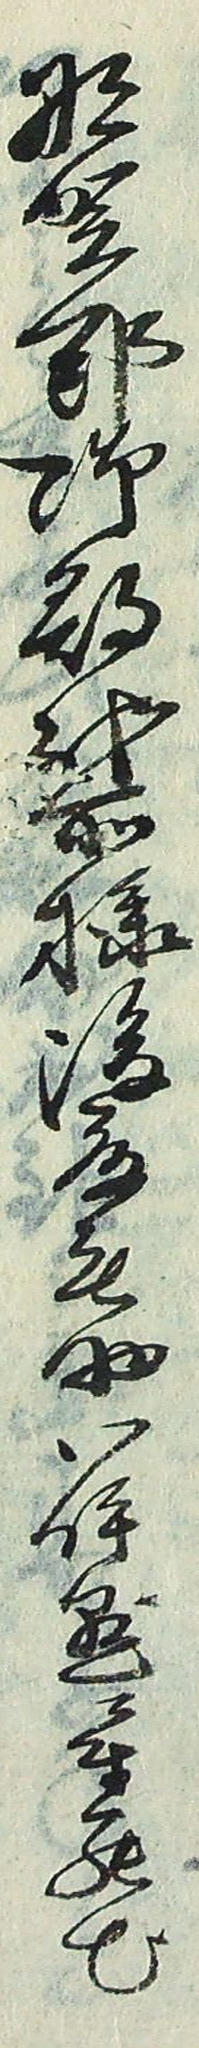那賀郡御郡代所様後藤庄助御呼懸ニ付罷出
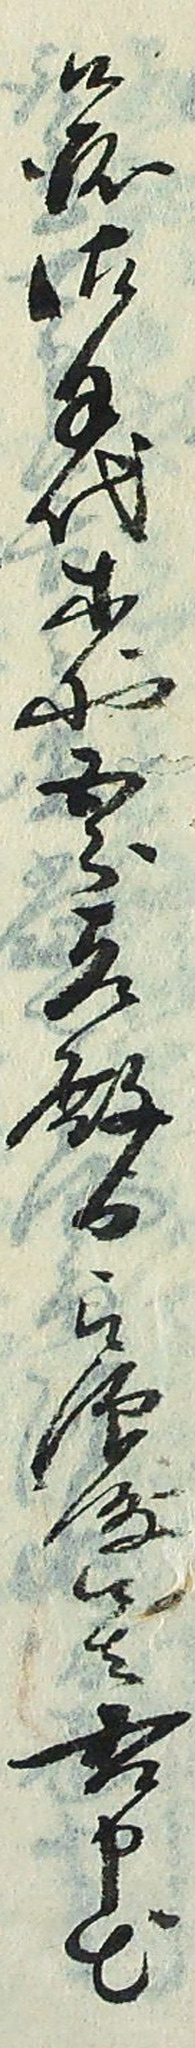候所御手代木村五郎吉殿ゟ被仰渡候者右申出
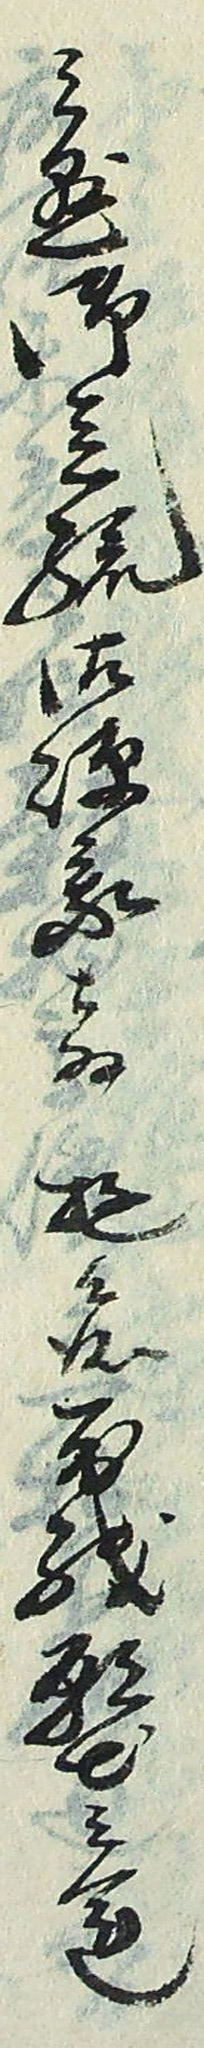之懸御壱統御評義被為遊候所別紙願出之運
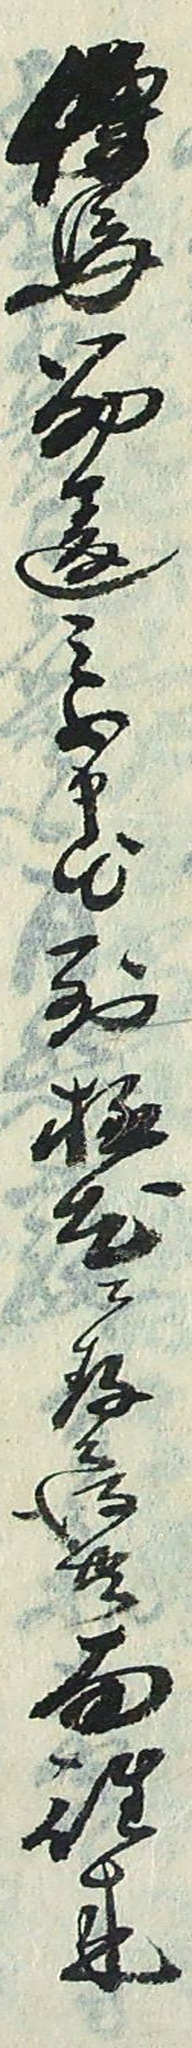傳馬筋違之義申出至極尤ニ存候得共南往来
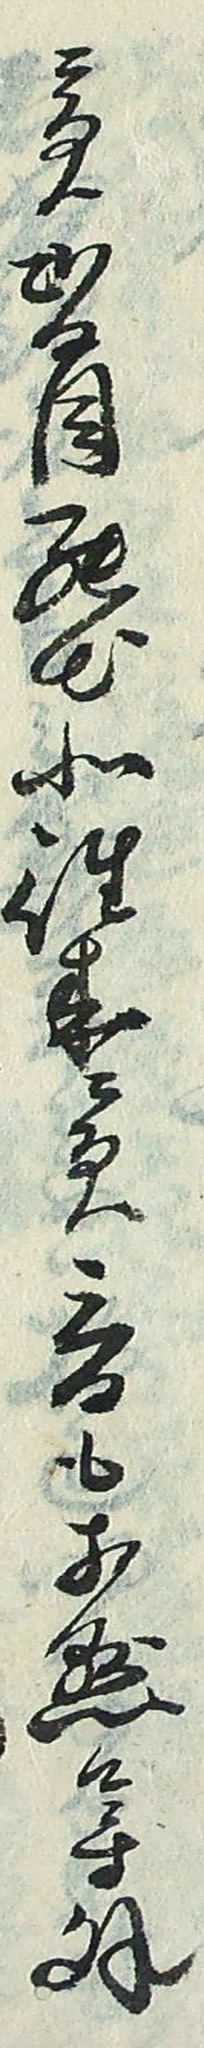ニ而ハ弐日目罷出北往来ニ而ハ三日も相懸候ニ付外
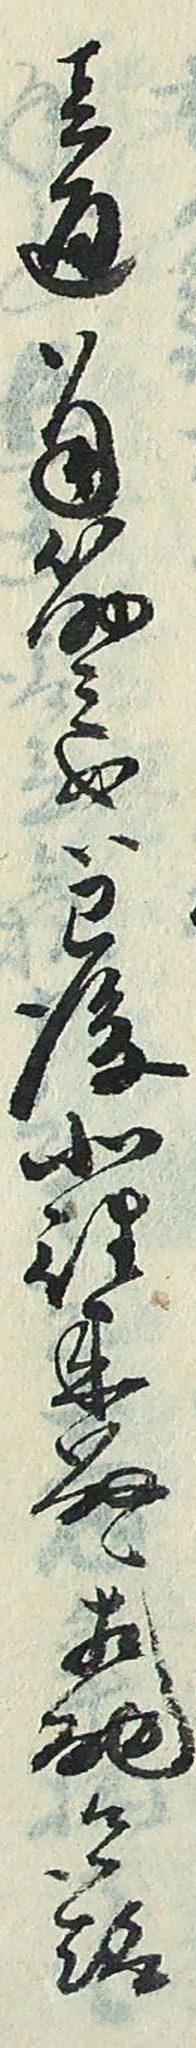壱通御用筋之義ハ已後北往来筋へ相配候御趣

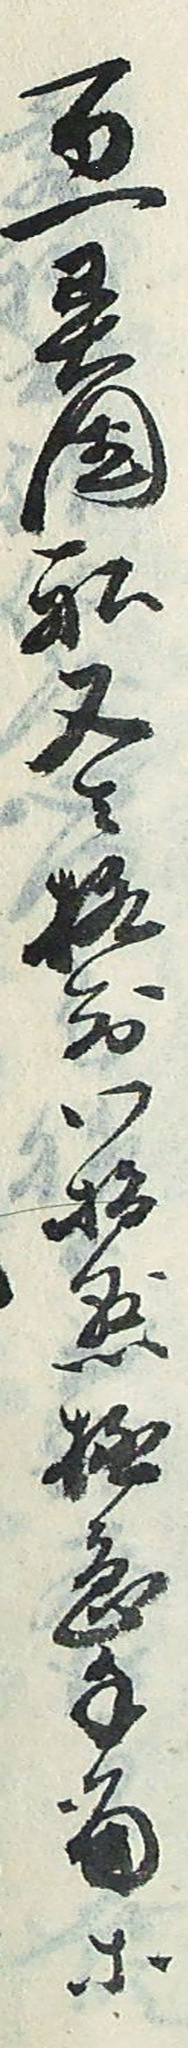万一異国舩又者格別御指懸極急手當等
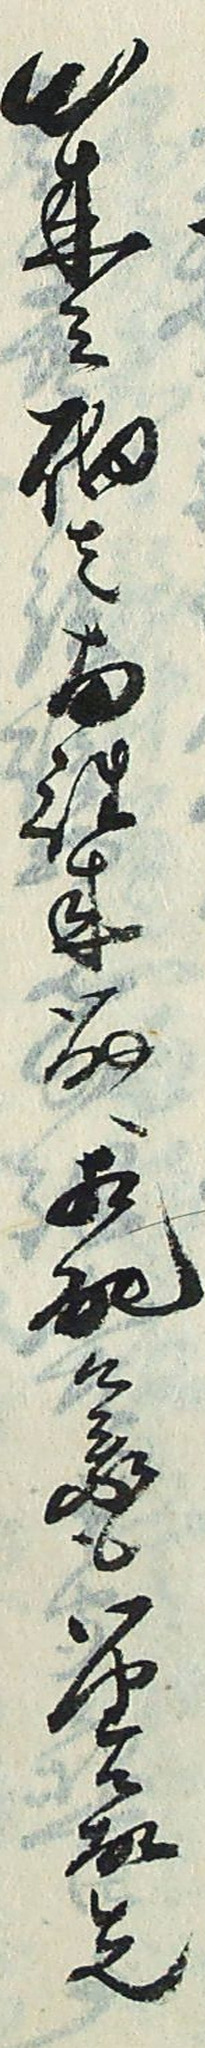出来之砌者南往来筋へ相配候義も御坐候故先
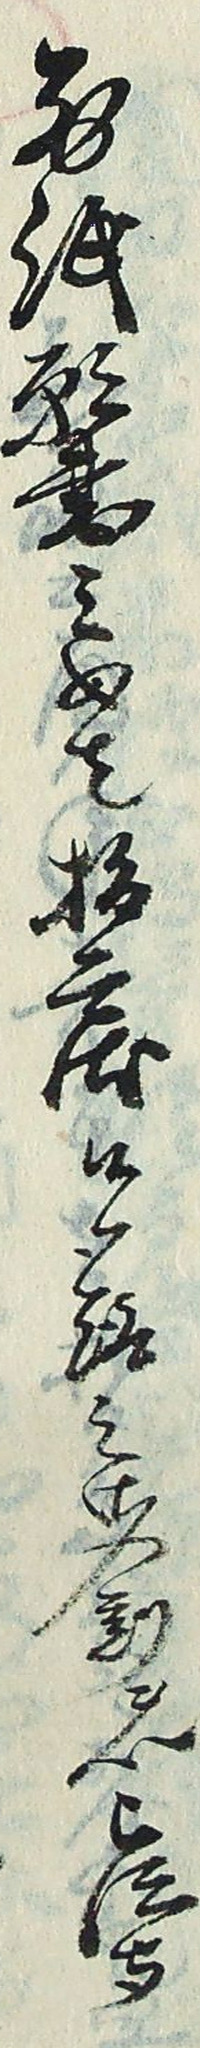別紙願書之義者指戻候御趣之御入割ヲ以被仰聞
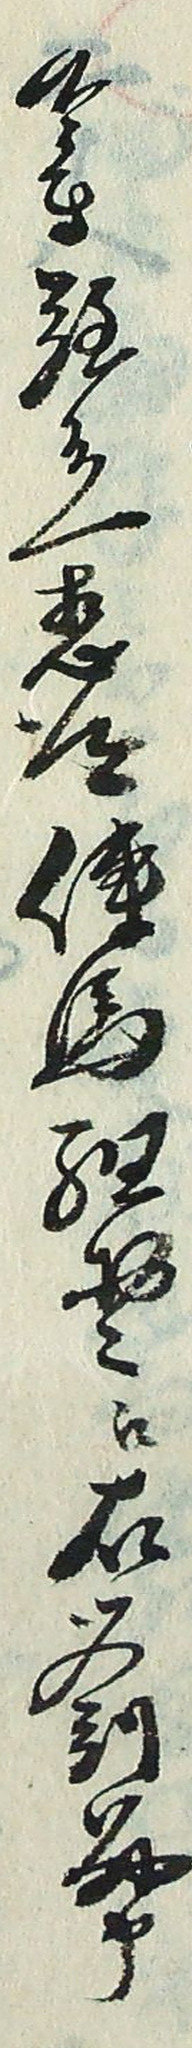候ニ付難有相心得傳馬組村々江右御入割筋申
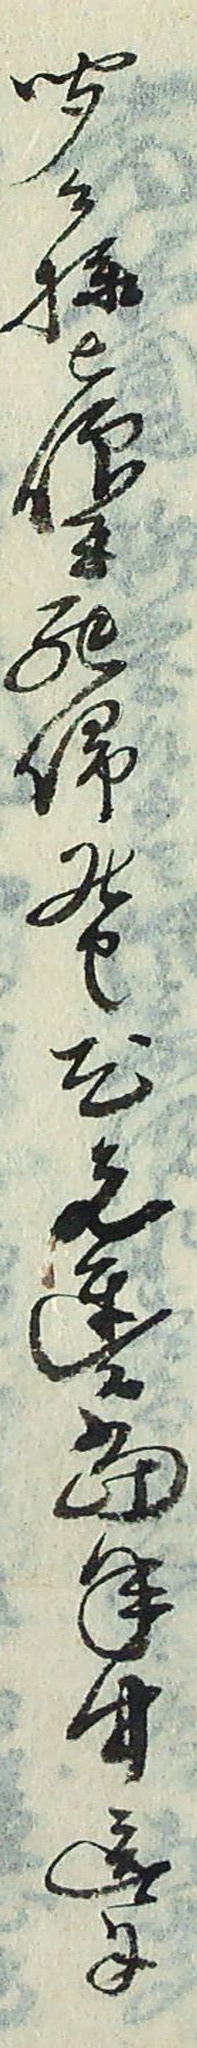聞候様被仰付罷帰居申候尤先達而當年中送候手
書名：諸御趣意書并御下知向之写
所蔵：鳴門教育大学 Naruto University of Education
